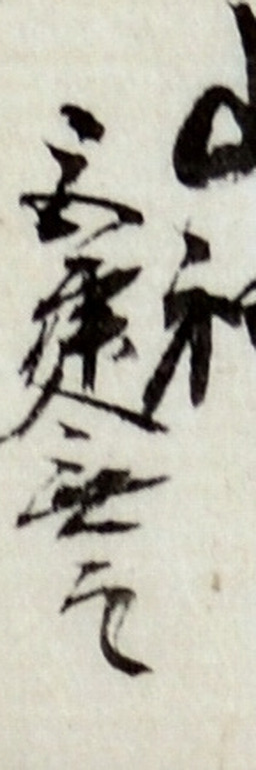宮建無之
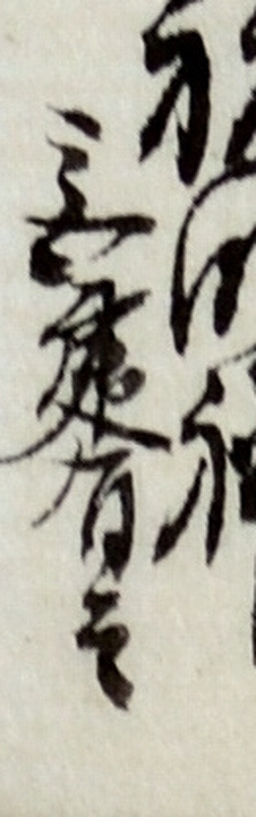宮建有之
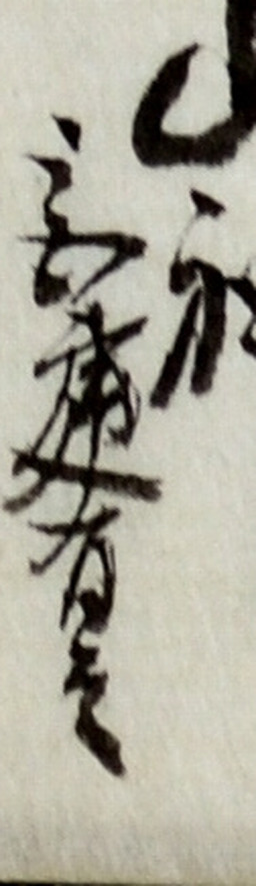宮建有之
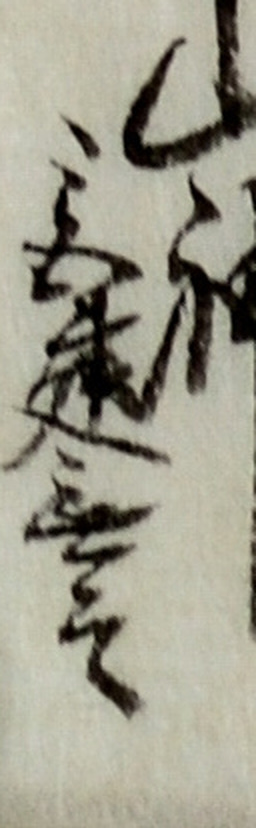宮建無之

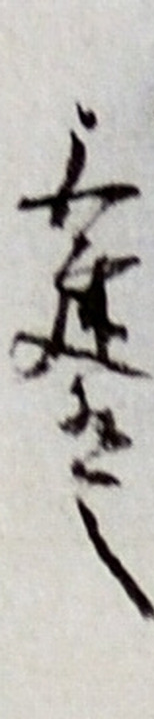宮建有之
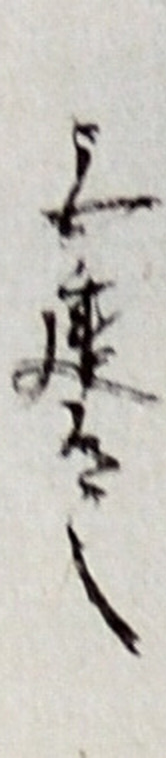宮建有之
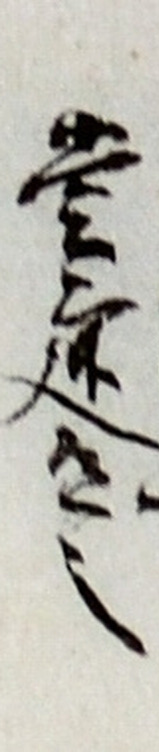宮建有之
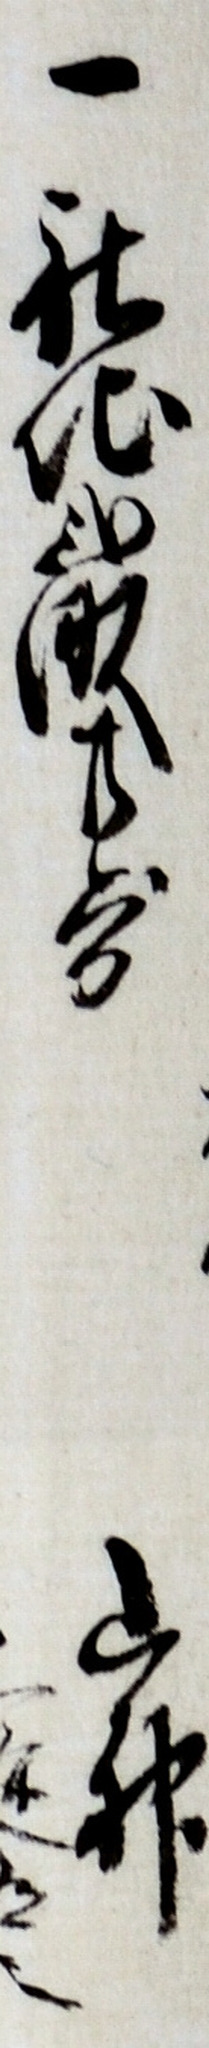一社地弐畝廿歩山神
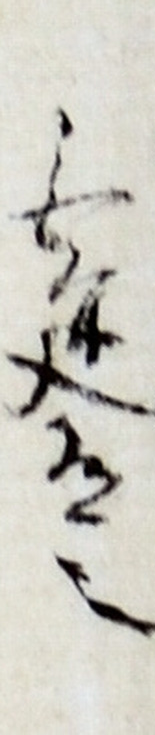宮建有之
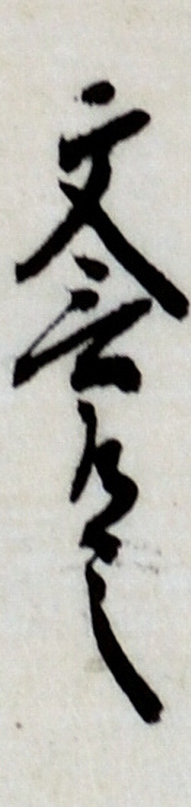文言有之
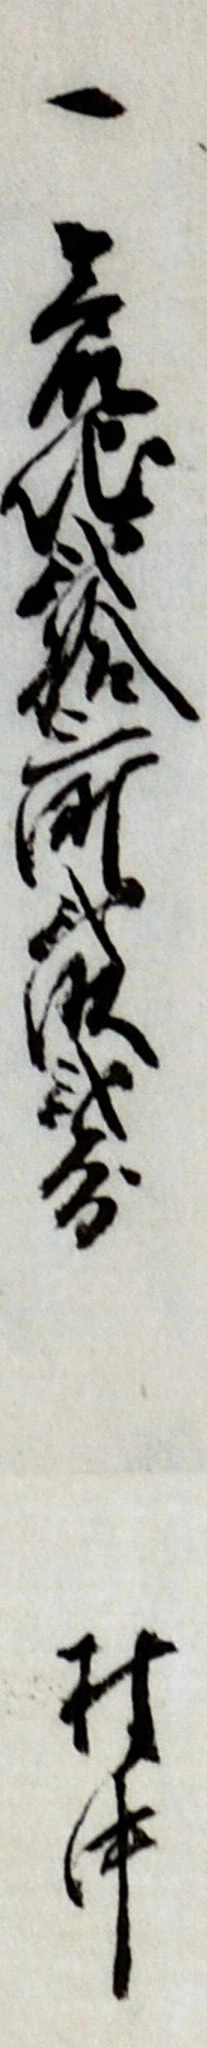一荒地弐拾三町弐畝弐歩村中
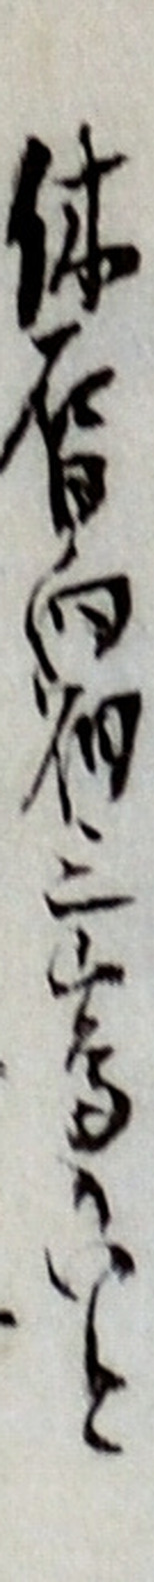休石日向畑三島かいと
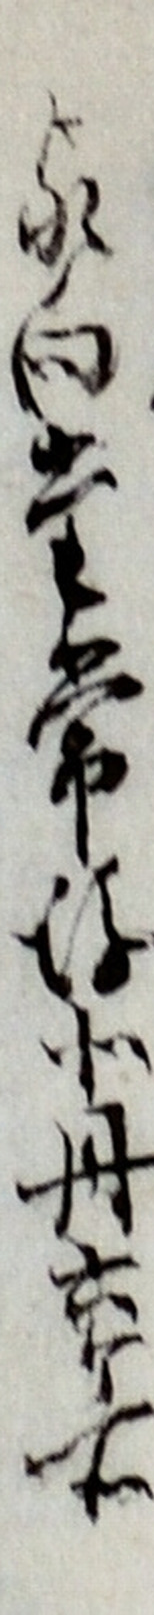家ノ向堂常後北丹六ケ所
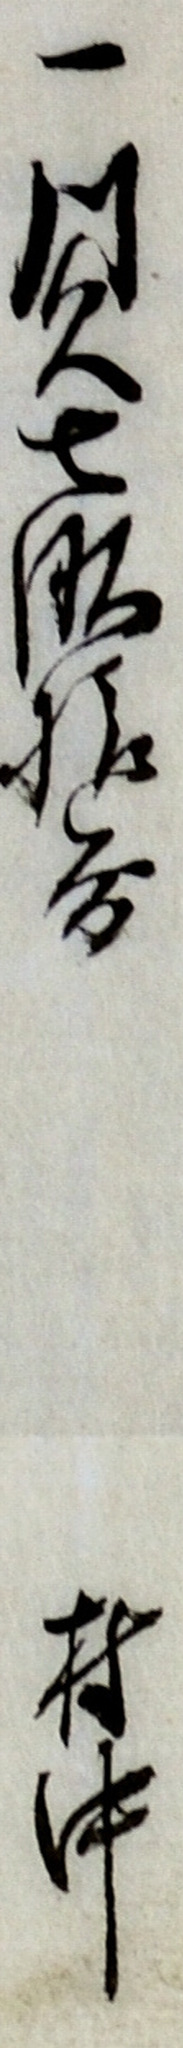一川欠七畝拾歩村中
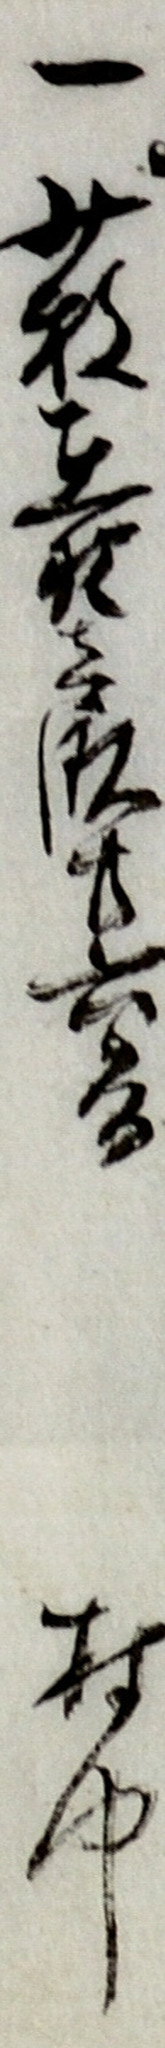一散在野壱畝廿六歩村中
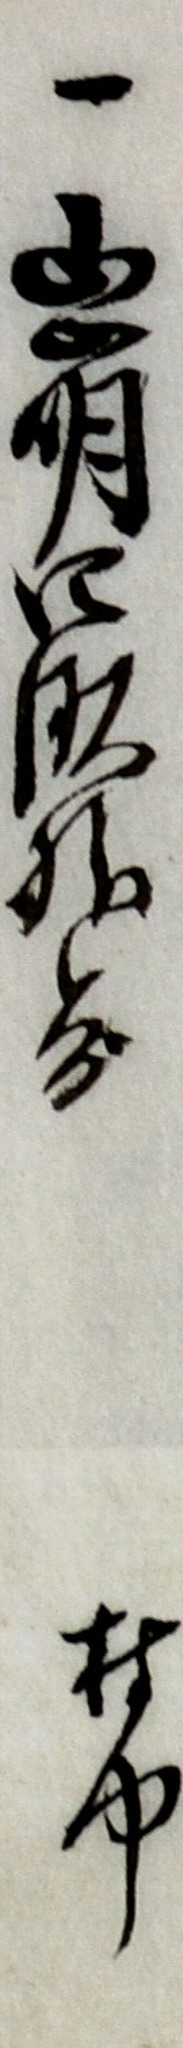一山崩四畝拾歩村中
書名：御領分中山林社地手控
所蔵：伊那市立高遠町図書館・合同会社AMANE
